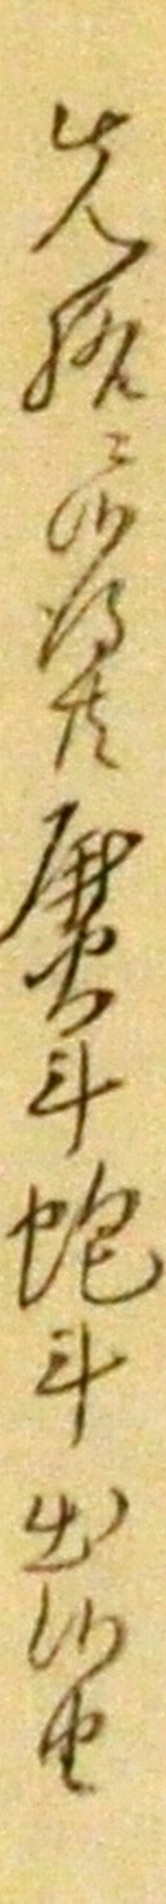先格に候得共熨斗蚫計出候由
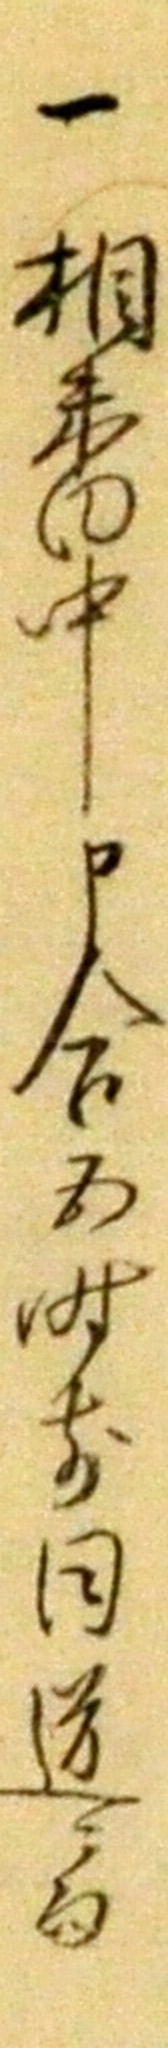一相番中申合五時前同道に而
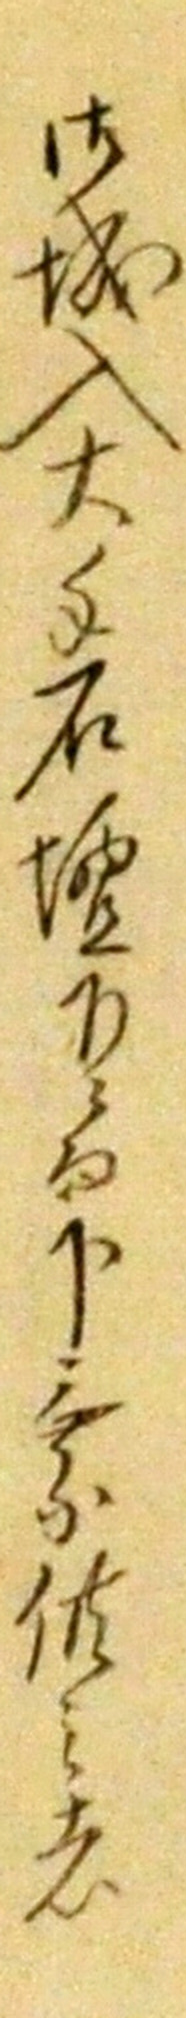御城入大手石壇下に而下乗供之者
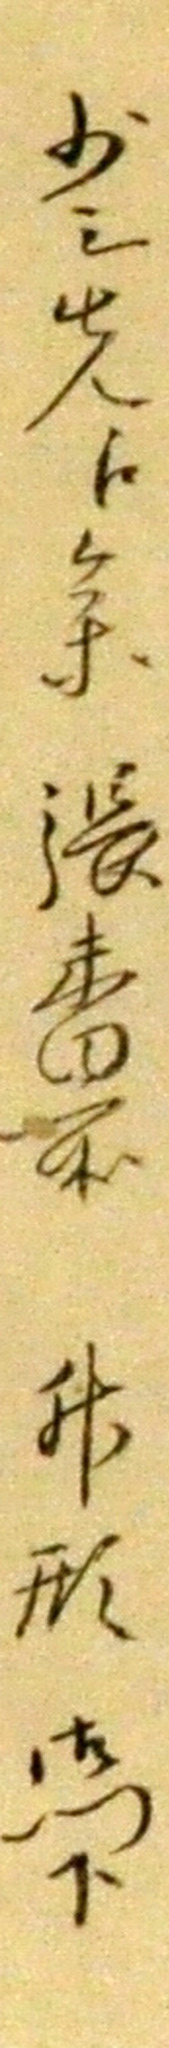少し先え参張番所升形御門下
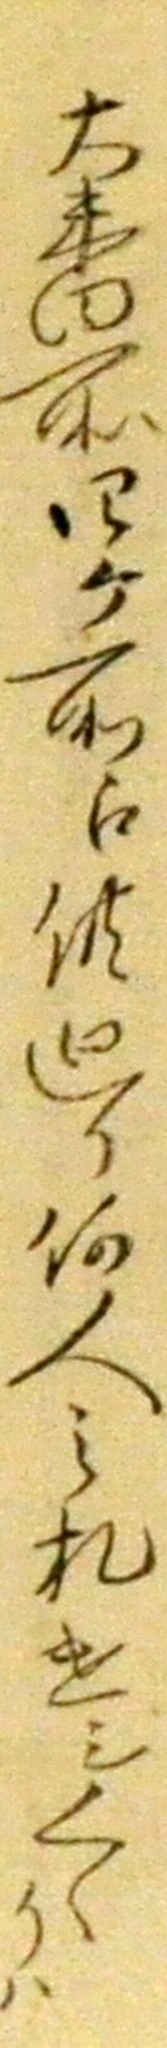大番所四ヶ所え供廻り何人之札遣シくヽりは
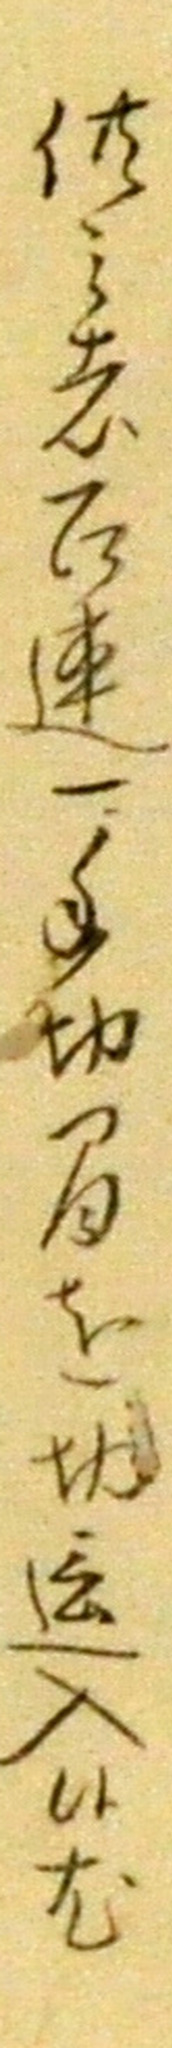供之者召連一手切間を切這入候尤
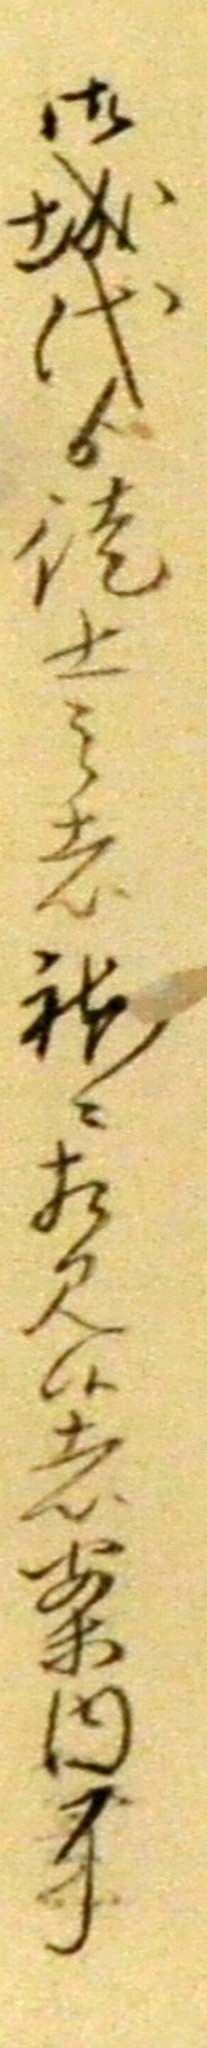御城代ゟ徒士之者躰に相見候は案内に
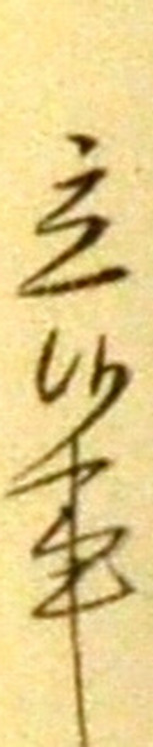立候事

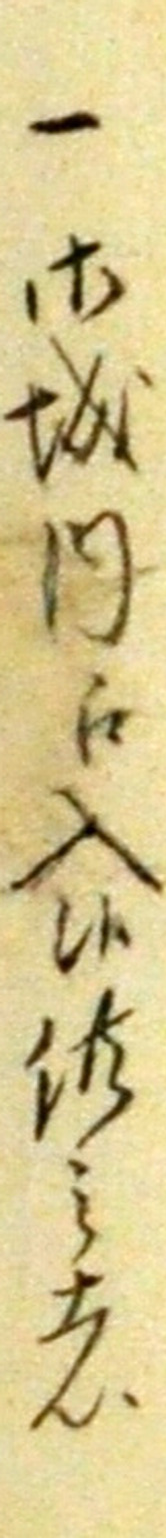一御城内え入候供之者
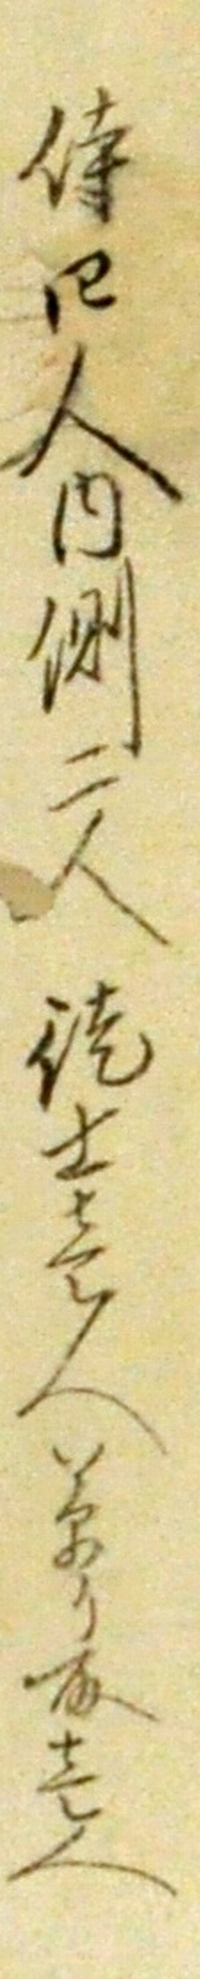侍四人内側二人徒士壱人草り取壱人
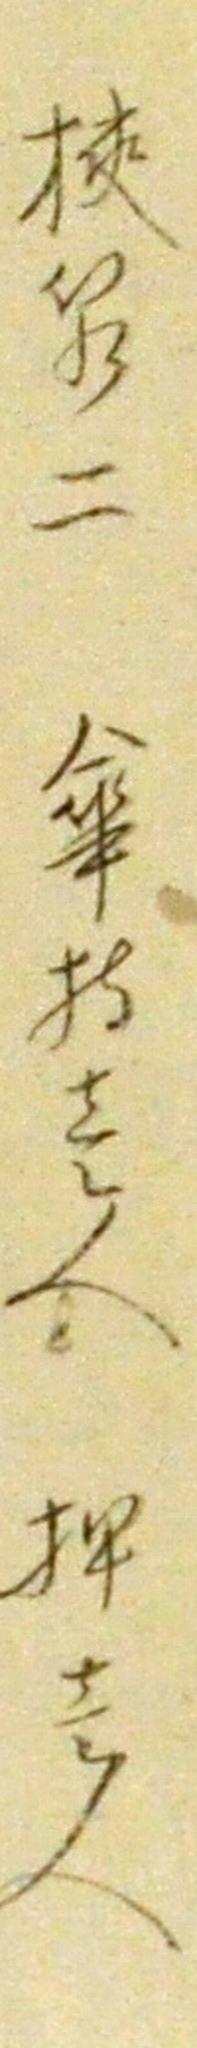挟箱二傘持壱人押壱人
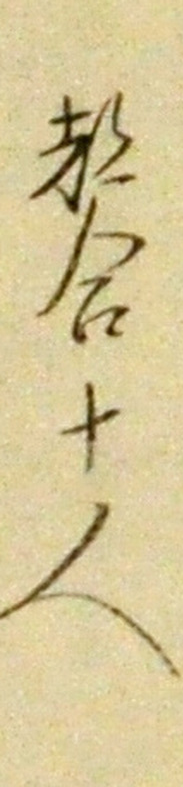都合十人
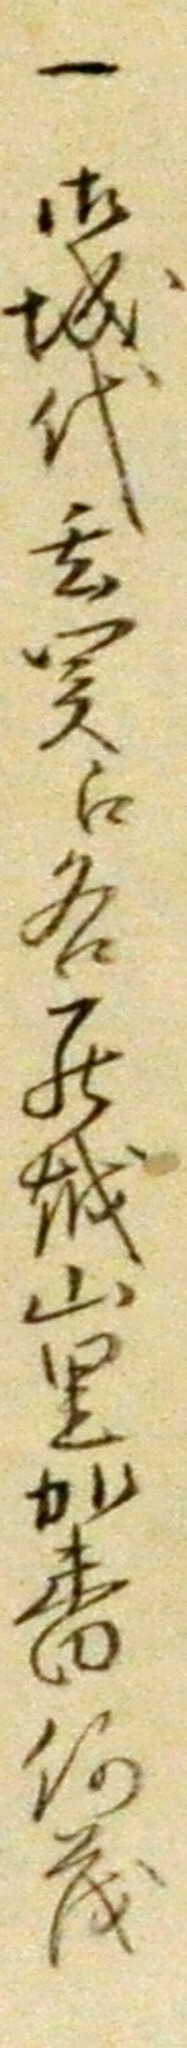一御城代玄関え各罷越山里加番何も
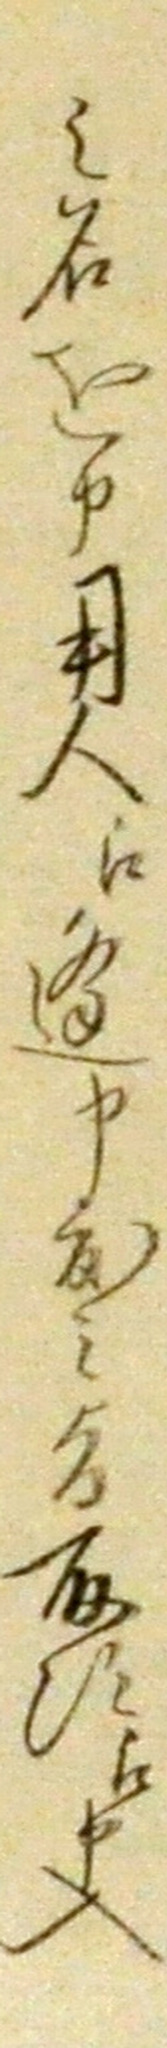之名を申用人え逢申度之旨取次え申入
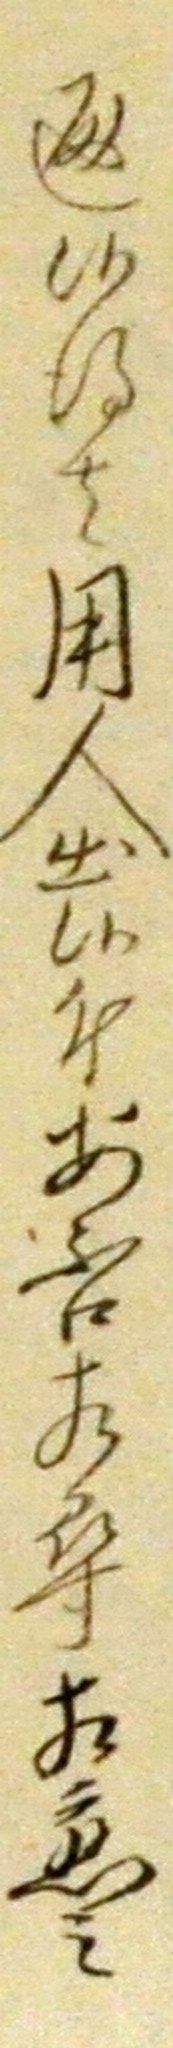通候得は用人出候付安否相尋相応之
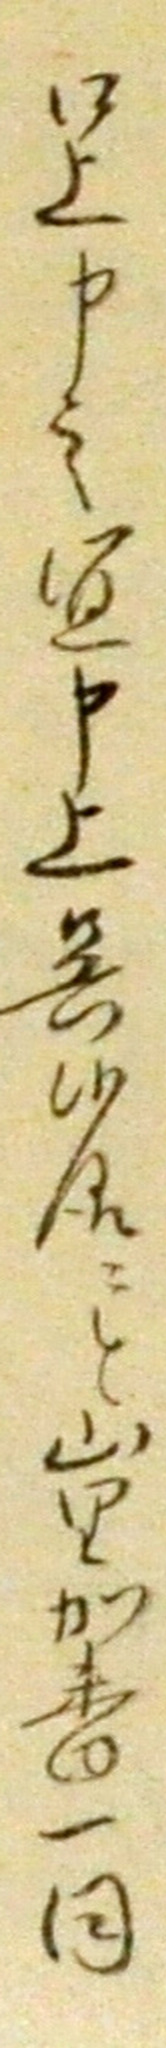口上申之宣申上呉候様にと山里加番一同
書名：大阪加番関係諸書留〔一括〕
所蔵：伊那市立高遠町図書館・合同会社AMANE
